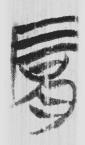{厂肙}
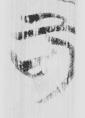可
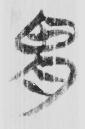胃
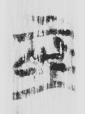亞
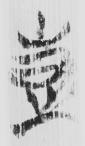彭
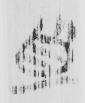且
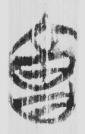會[合]
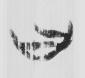曰
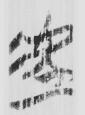𫊟
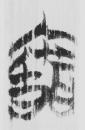{尒䎽}
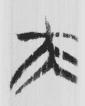夫
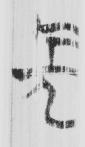長
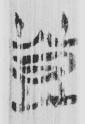莫
